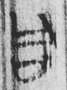同
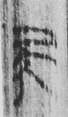而
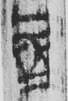僉
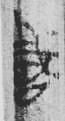○（察）
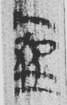僉
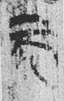而
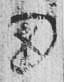困
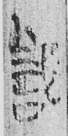○（察）
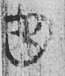困
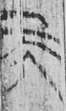而
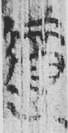○（復）
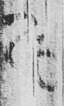氏（是）
